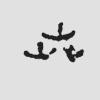卉
